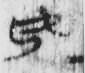𡚦（焉）
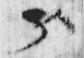孑
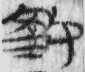執
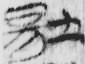塲
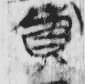賈
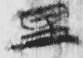里
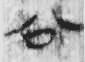公
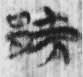邞
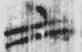士
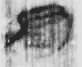尹
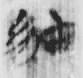紬
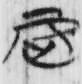○（返）
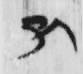孑
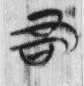言
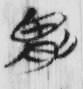{胃刀}（謂）
